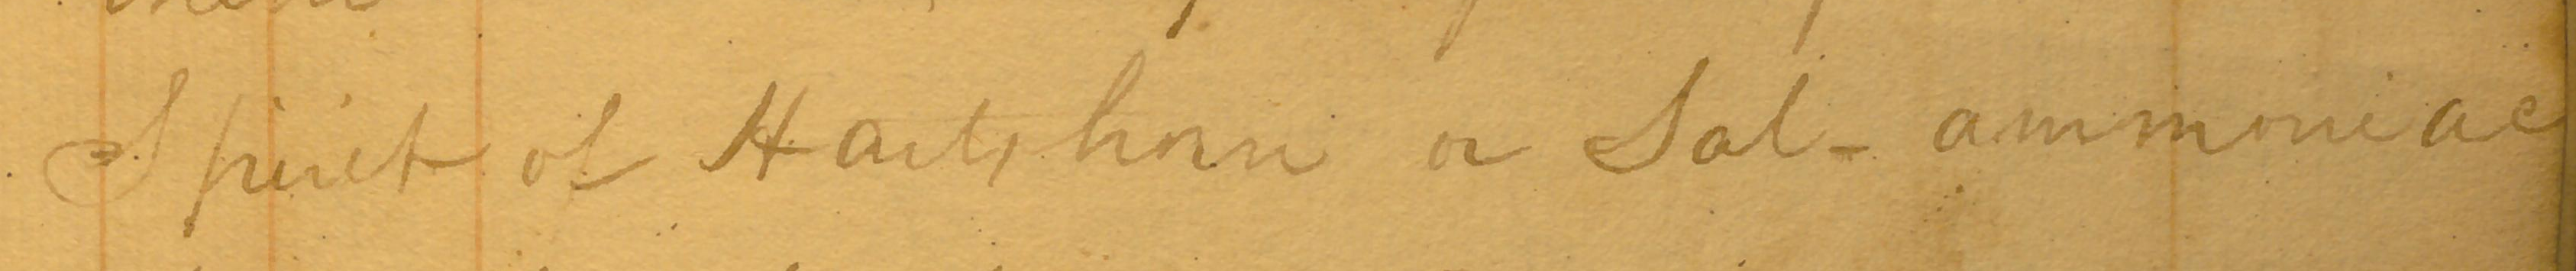Spirty of Hartshorn or Sal-ammoniae
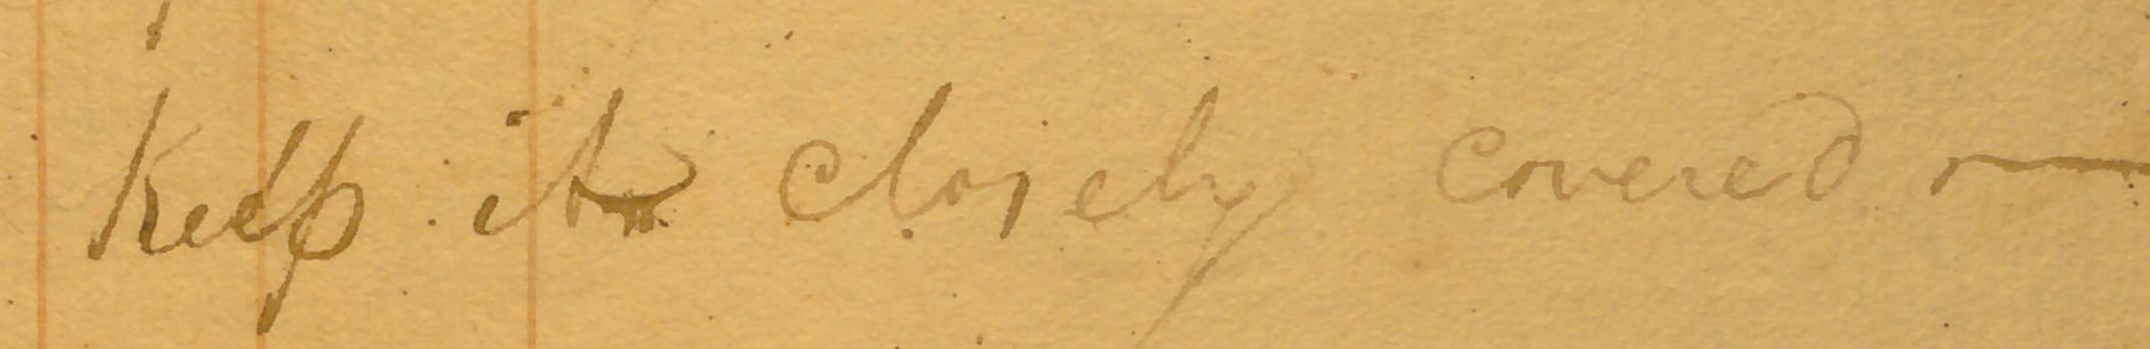Keep it closely covered-
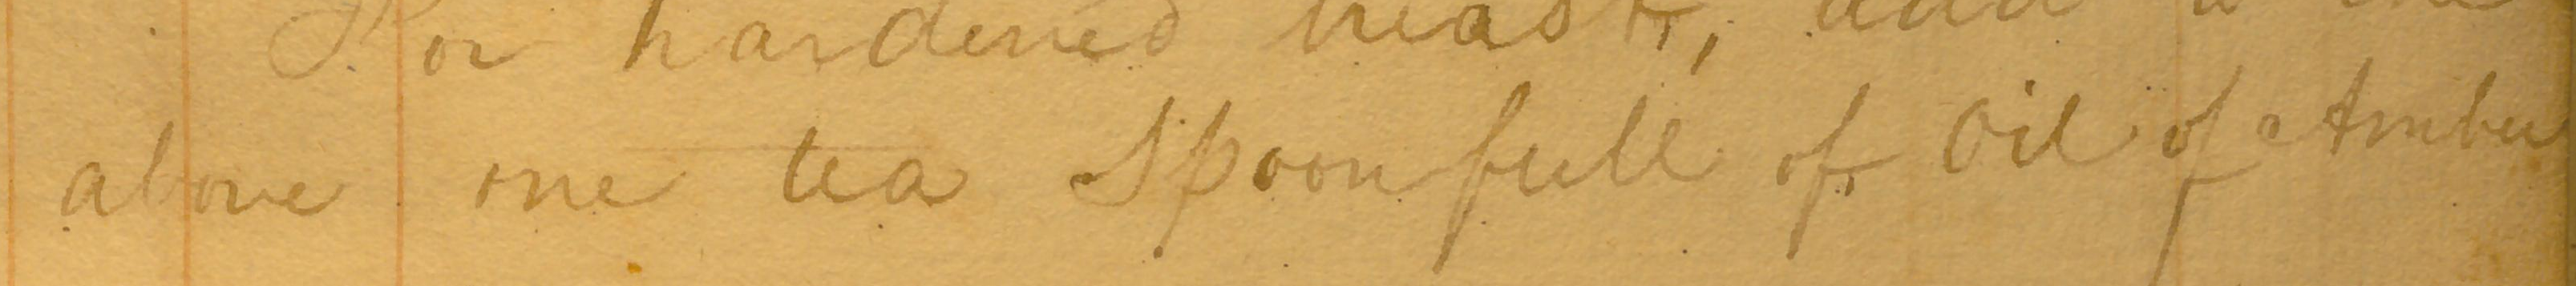above one tea spoonfull of oil of Amber
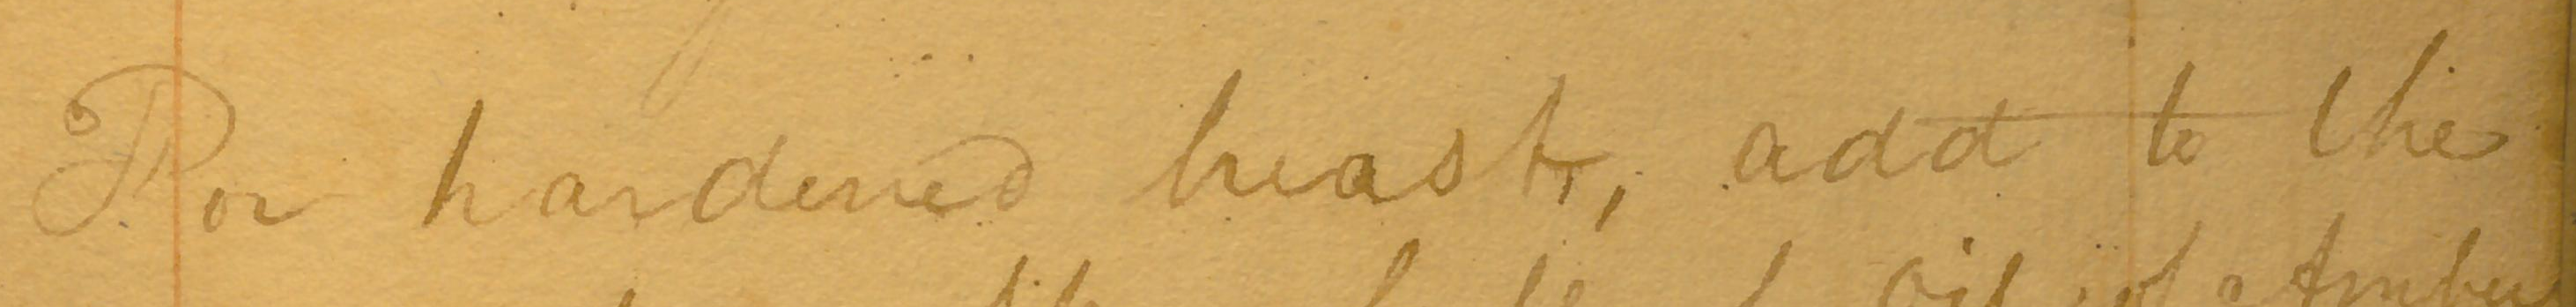For hardened breast, add to the
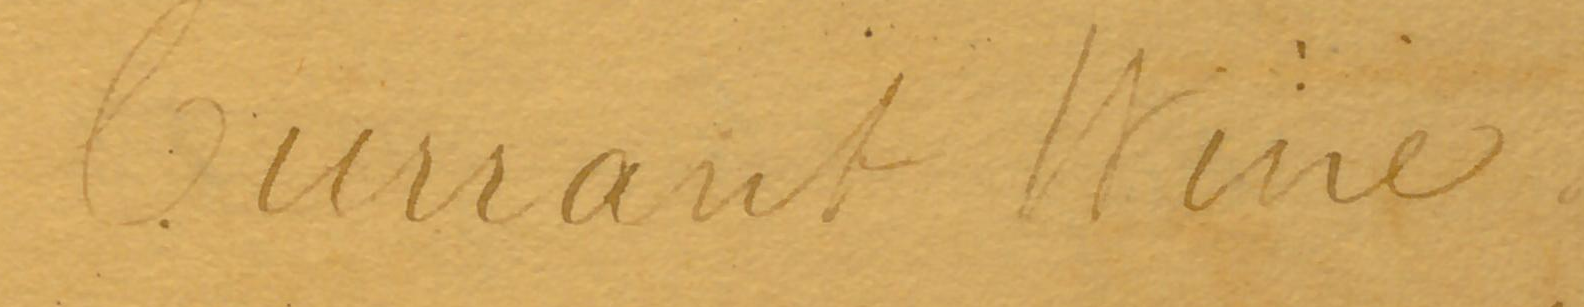Currant wine
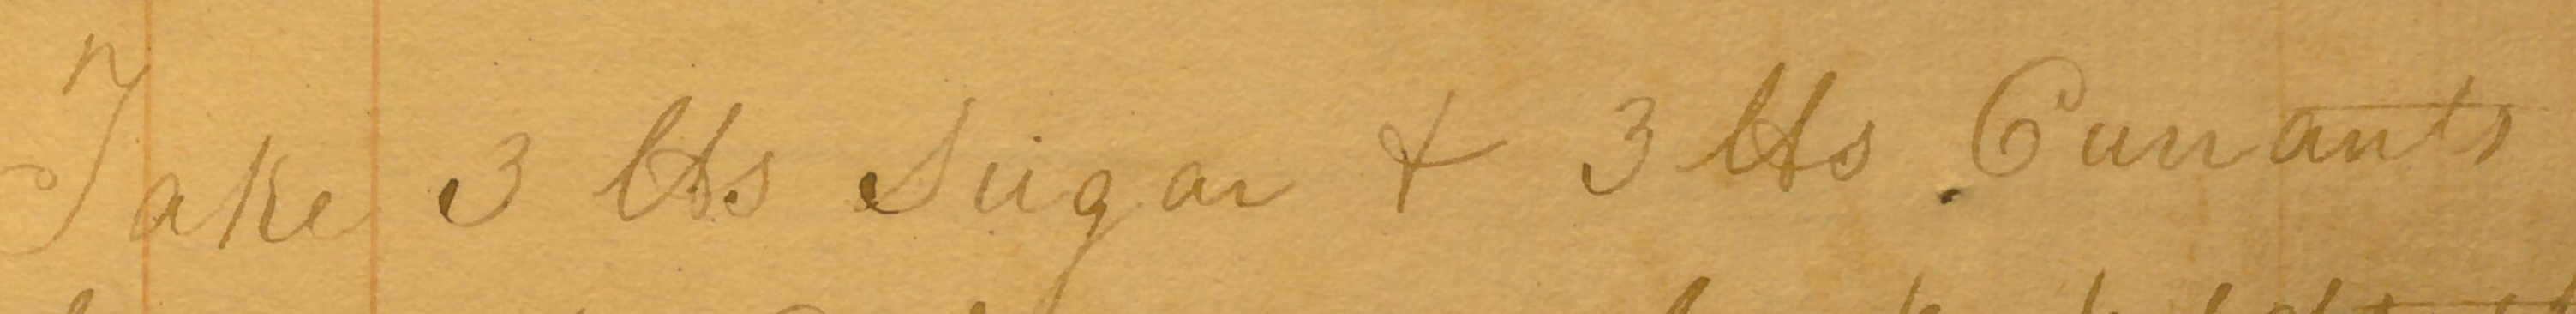Take 3 lbs Sugar & 3 lbs Currants
